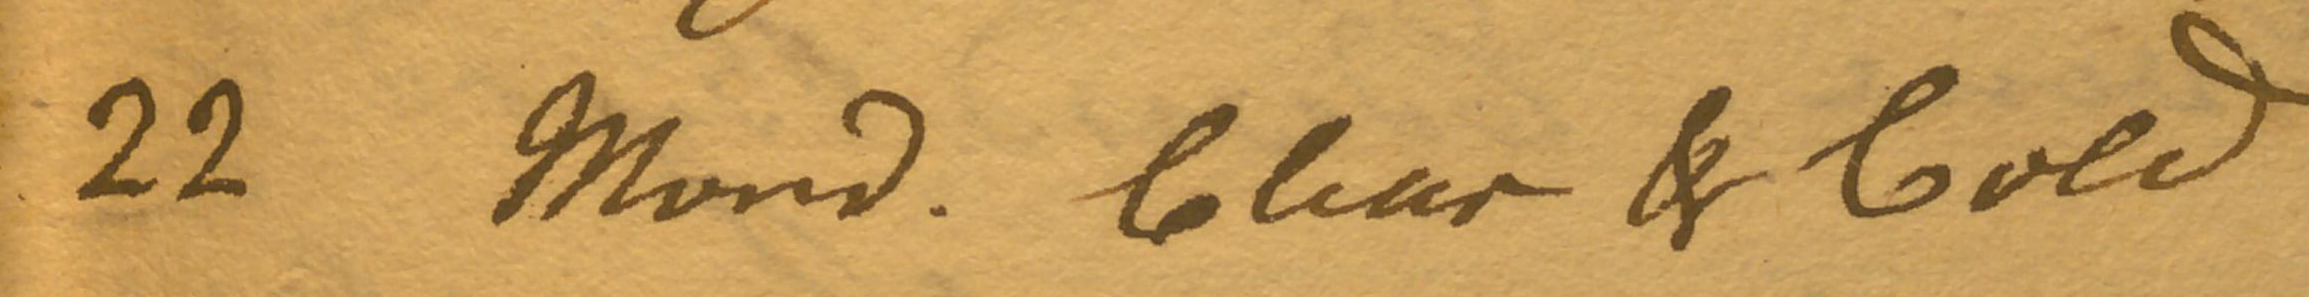22 Mond. Clear & Cold
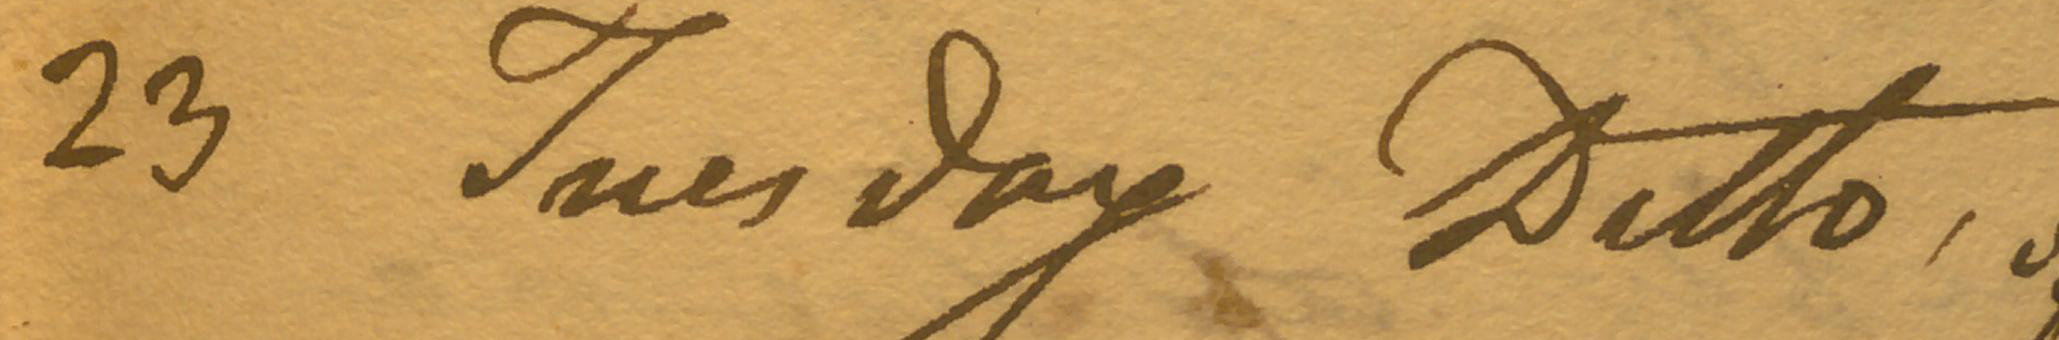23 Tuesday Ditto,
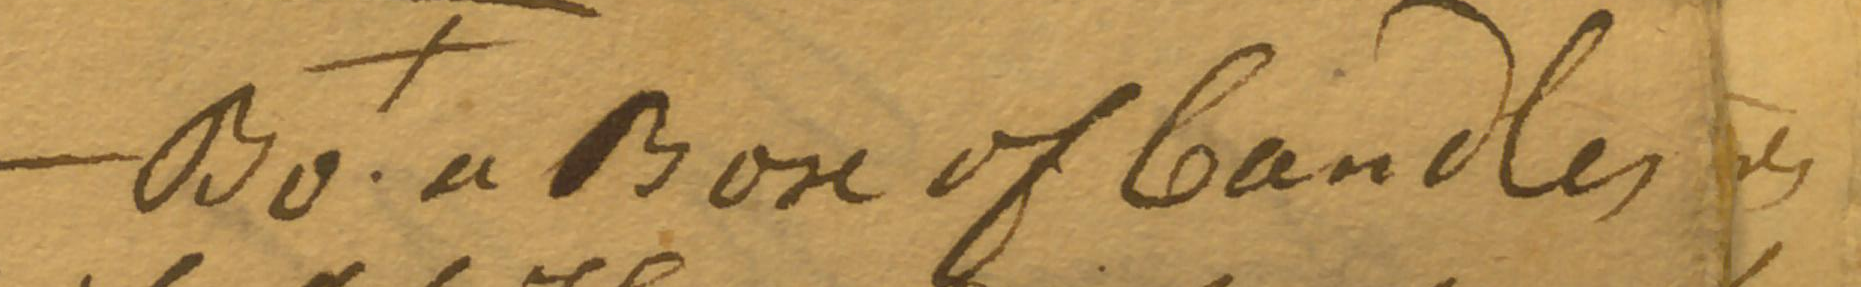Bo^t. a Box of Candles
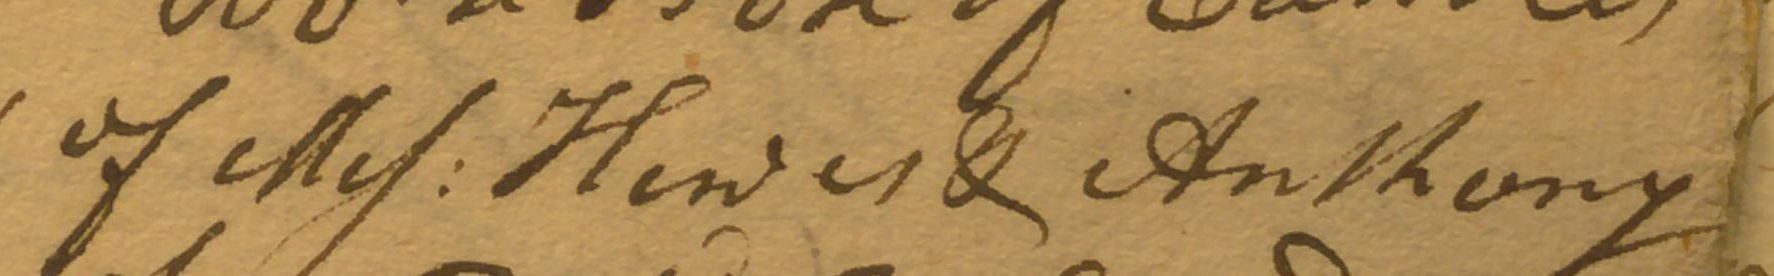of Mes: Hewes & Anthony
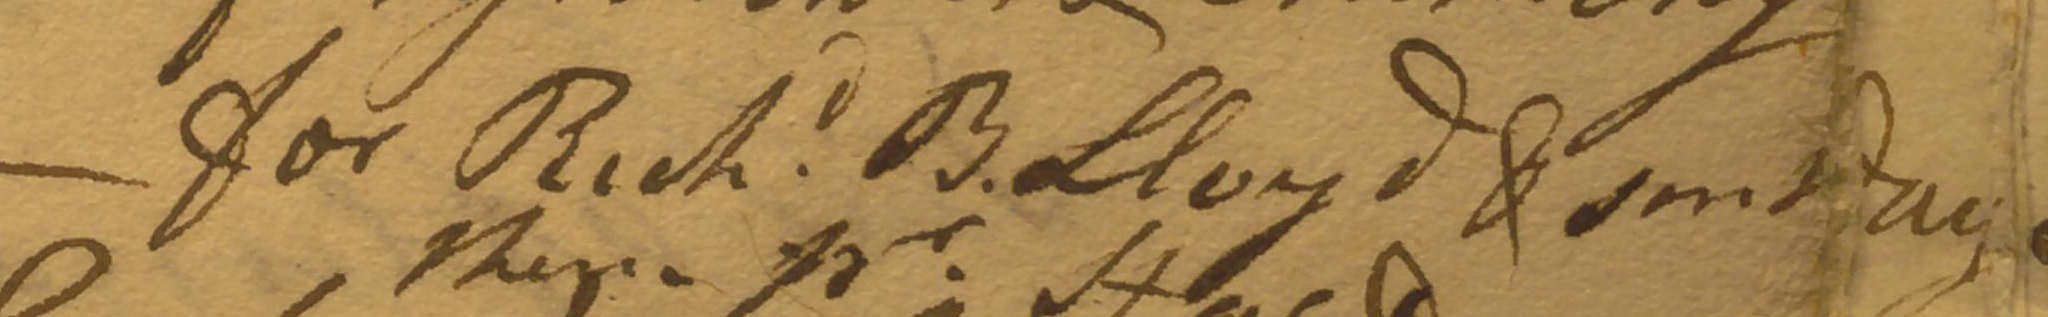for Rich^d. B. Lloyd & sent
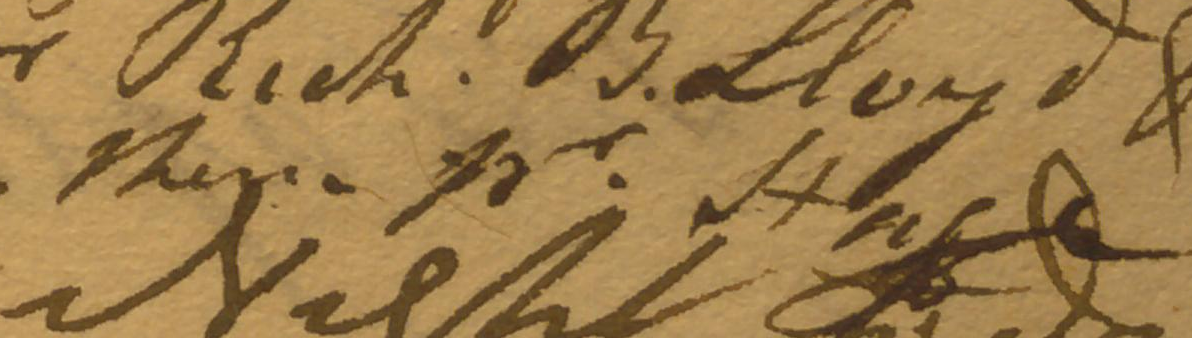them p^r. stage
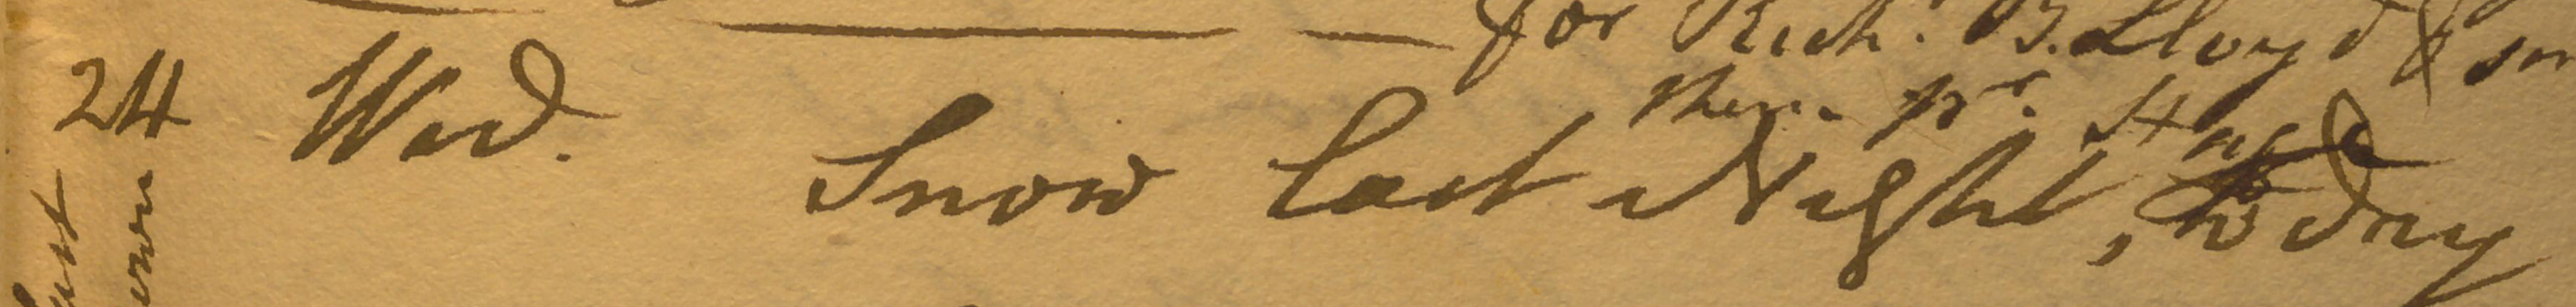24 Wed. Snow last Night, today
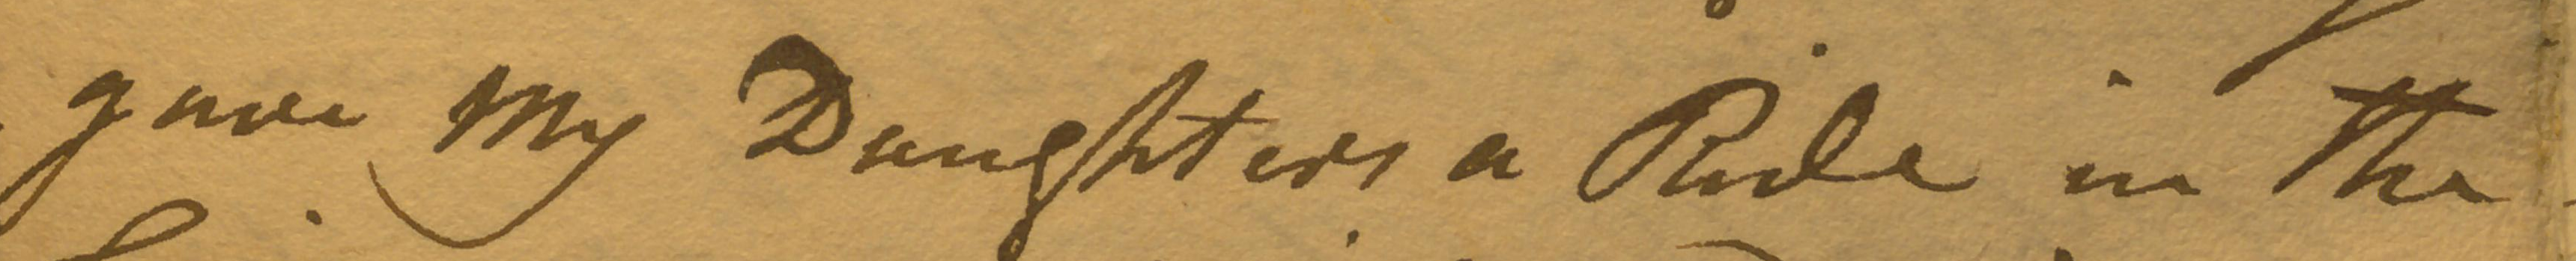gave My Daughters a Ride in the
